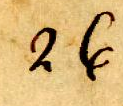26
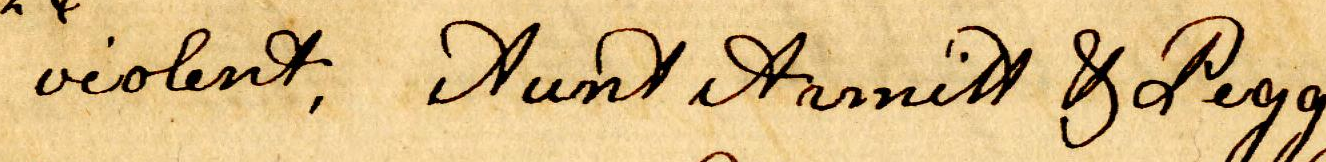violent, Aunt Armitt & Peggy
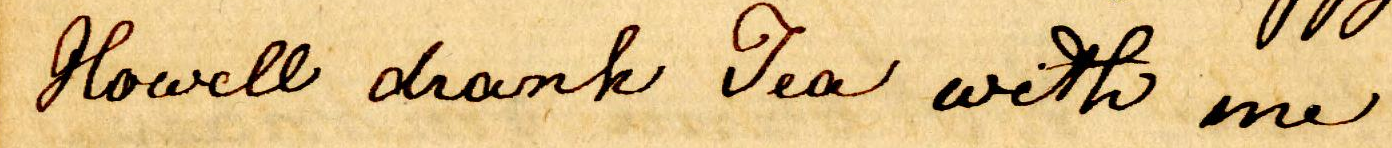Howell drank Tea with me
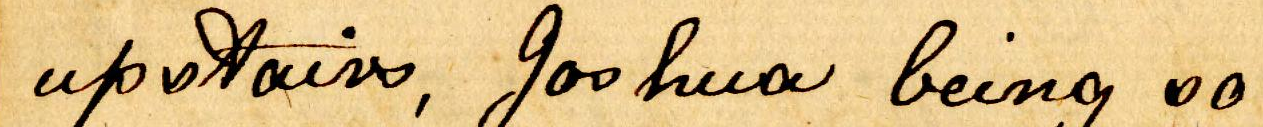upstairs, Joshua being so
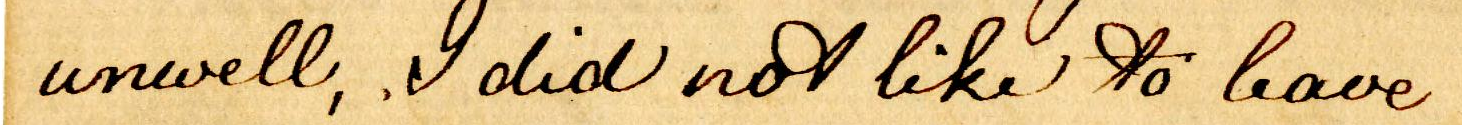unwell, I did not like to leave
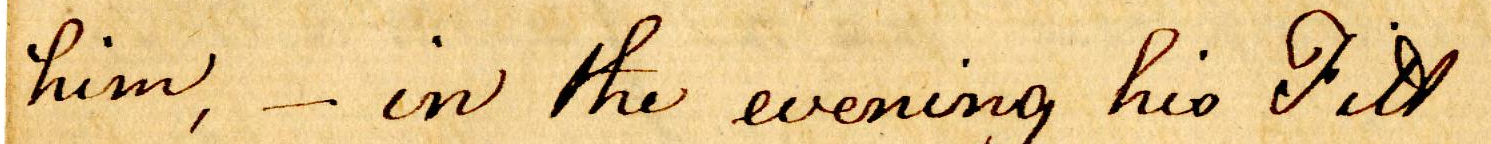him,- in the evening his Fitt
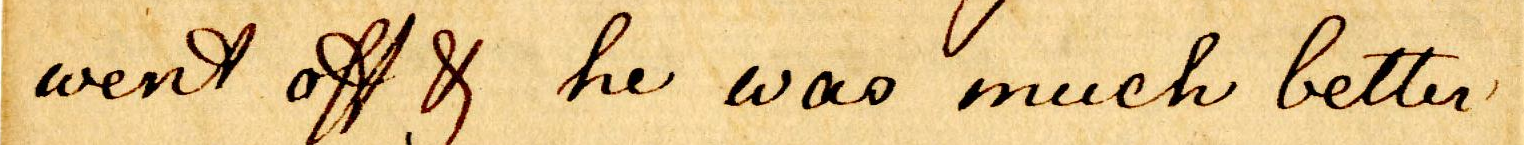went off & he was much better
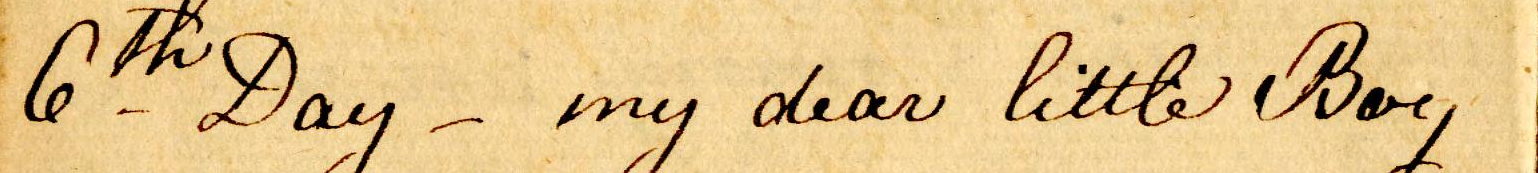6^th Day- my dear little Boy
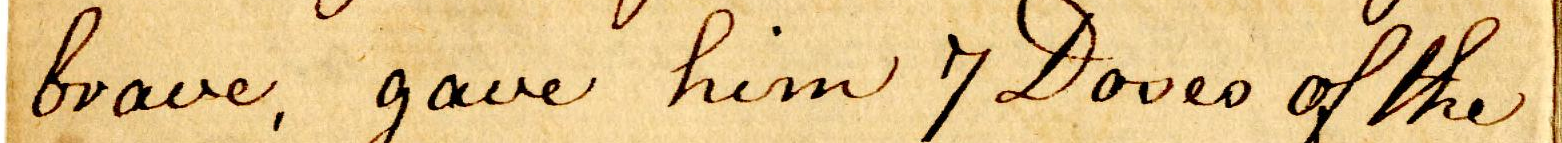brave, gave him 7 Doses of the
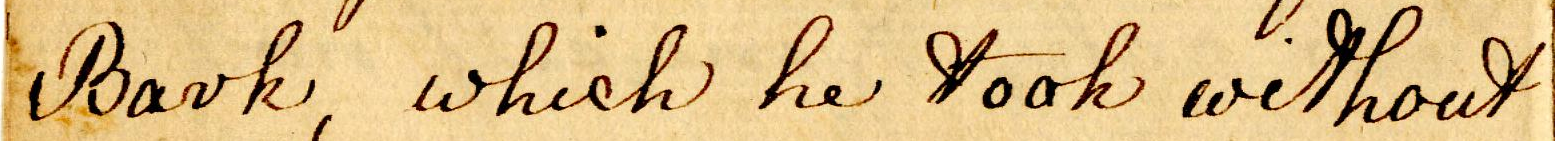Bark, which he took without
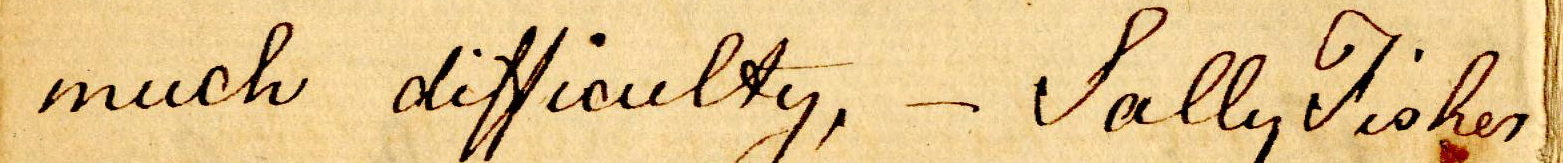much difficulty,- Sally Fisher
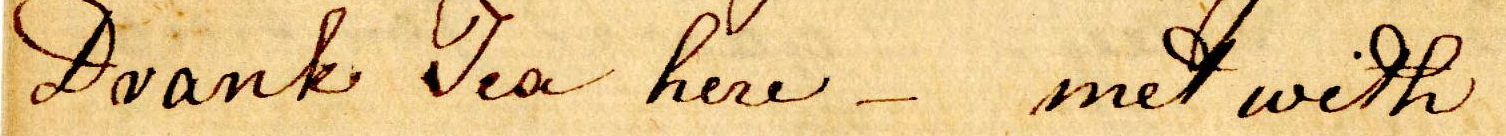Drank Tea here- met with
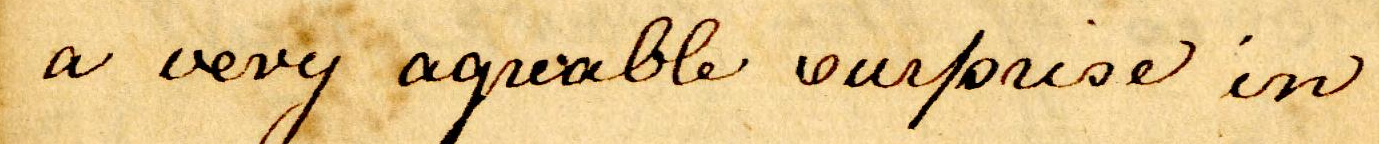a very agreable surprise in
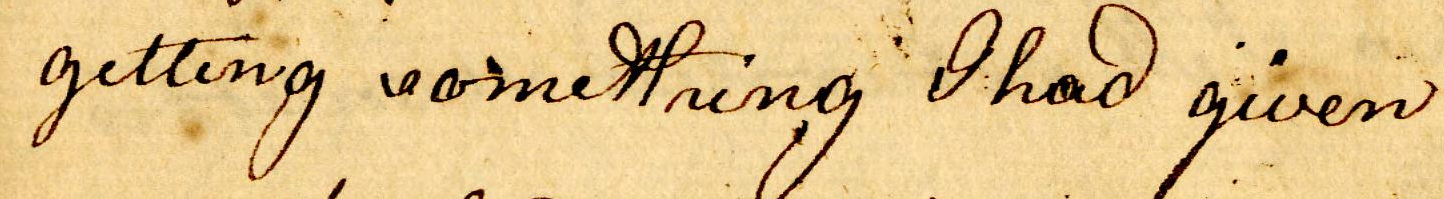getting something I had given
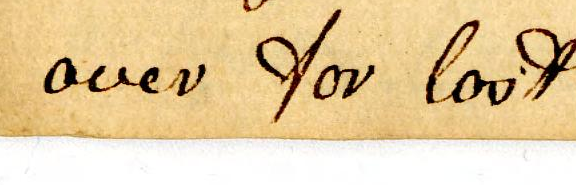over for lost
